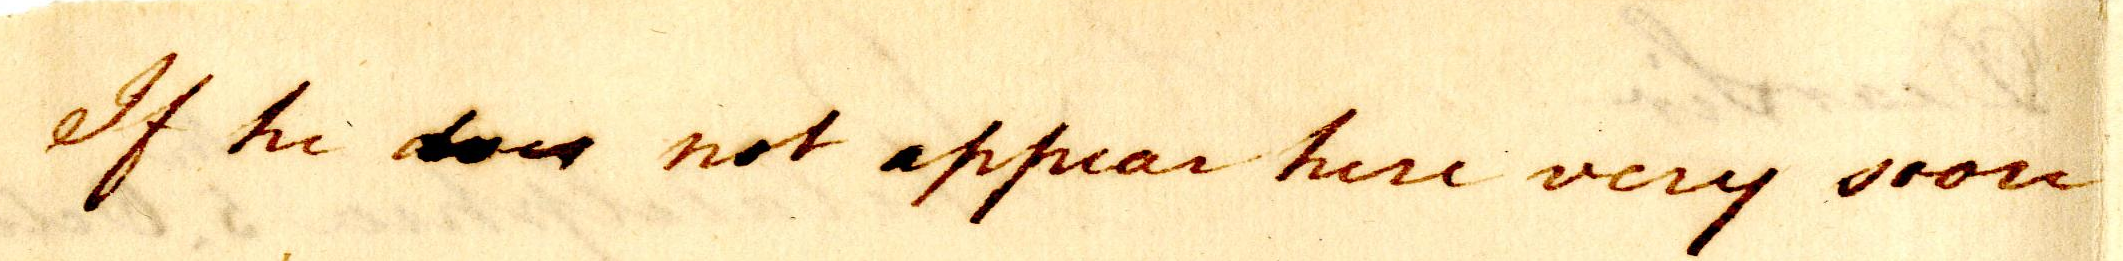If he does not appear here very soon
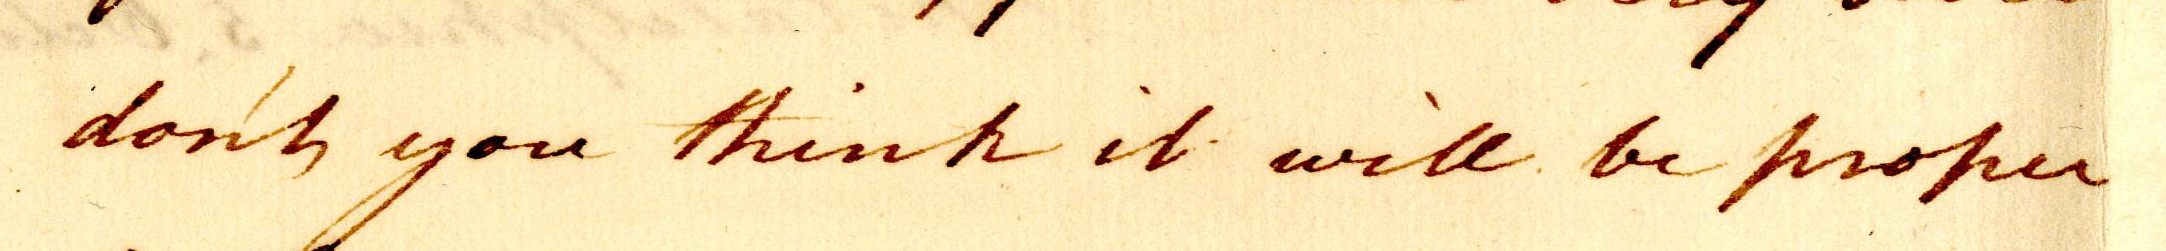dont you think it will be proper
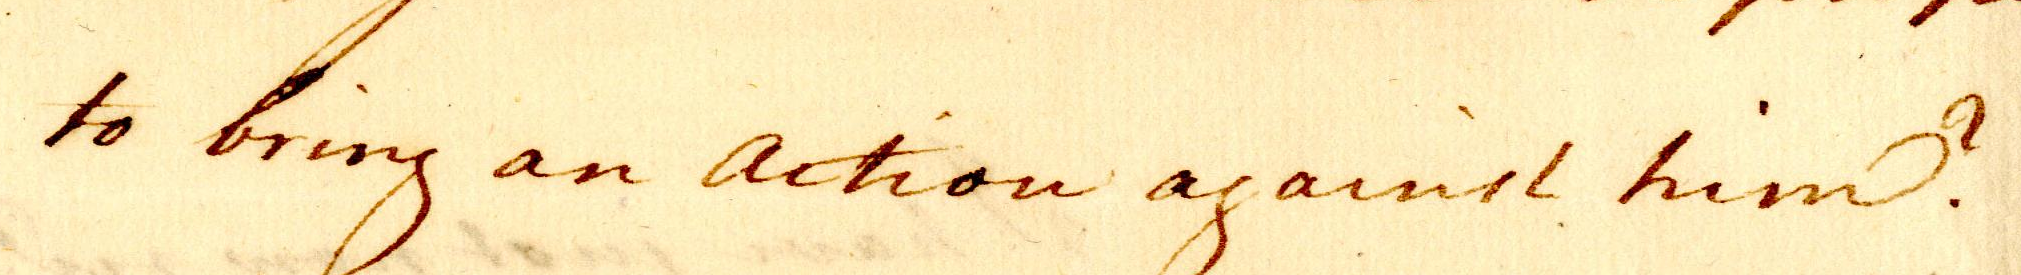to bring an Action against him?
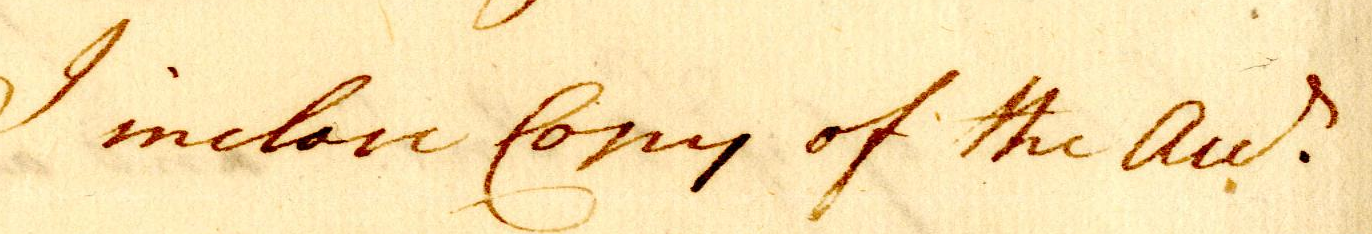I inclose Copy of the Acc^t.
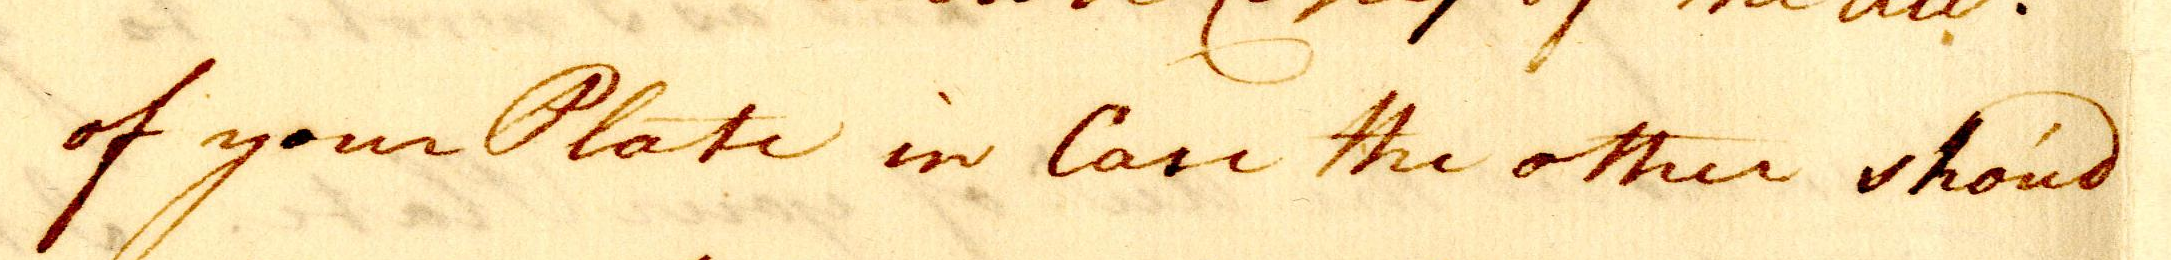of your Plate in Case the other shou'd
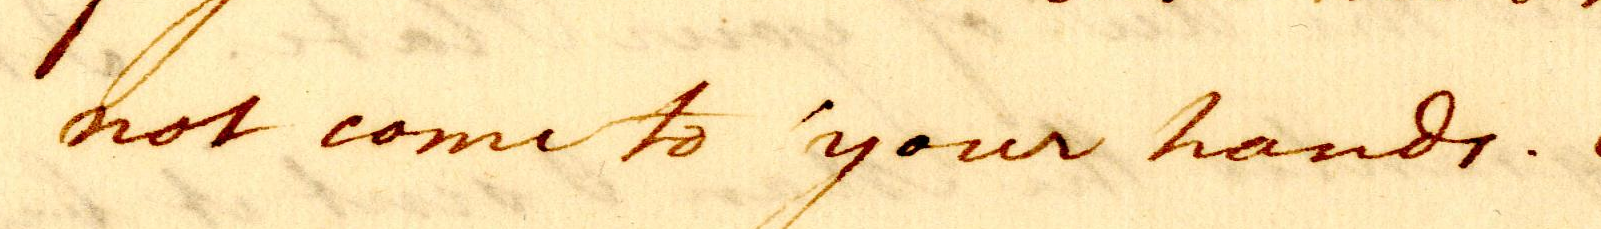not come to your hands.
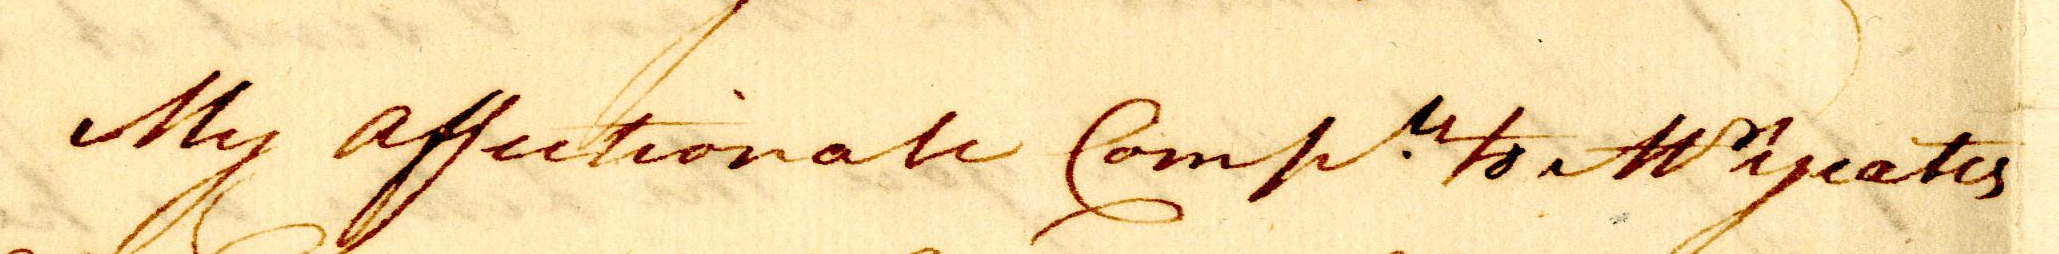My affectionate Comp^n. to M^r Yeates
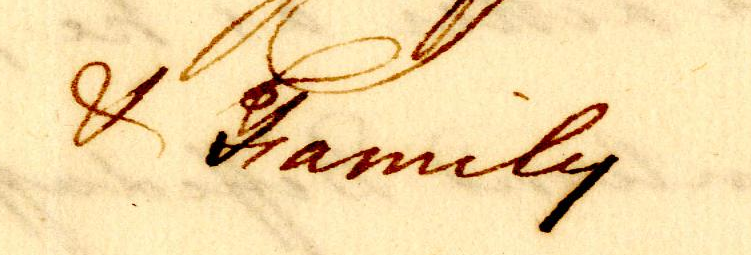& Family
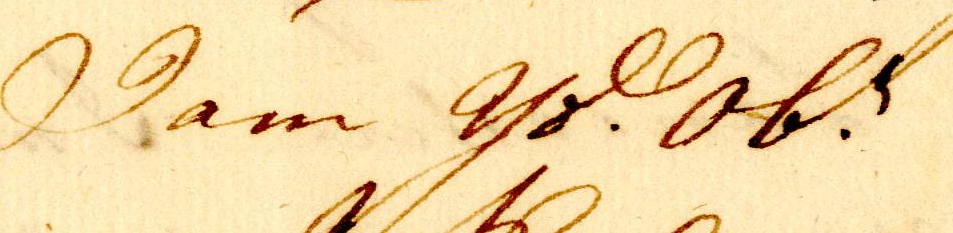I am Yo^r. Ob^t.
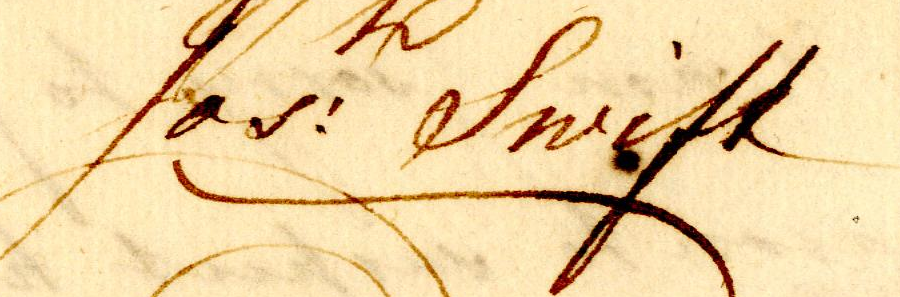Jos^h: Swift
